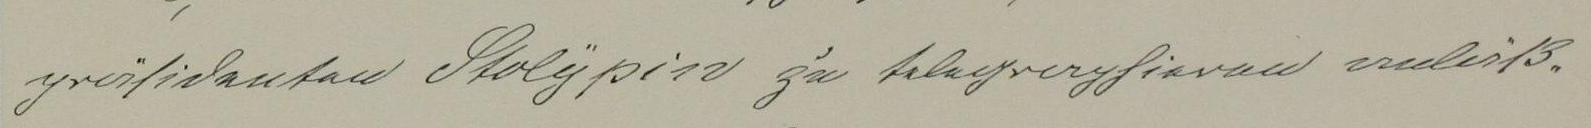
präsidenten Stolypin zu telegraphieren anläß-
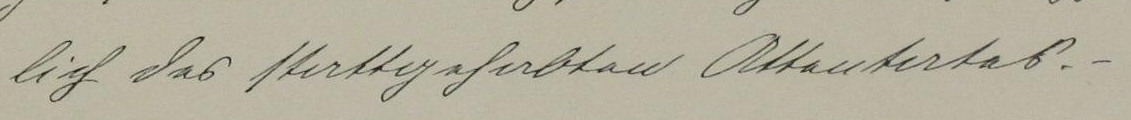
lich des stattgehabten Attentates.
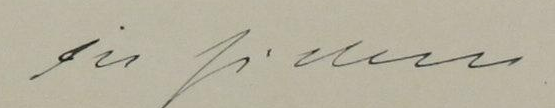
in fidem
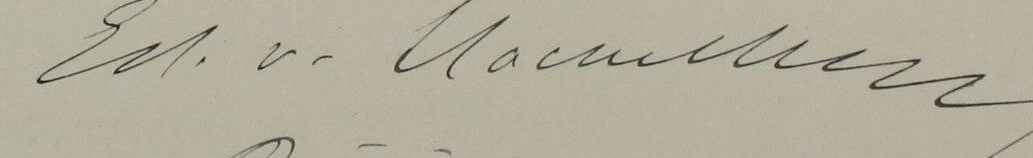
Ed. v. Stackelberg
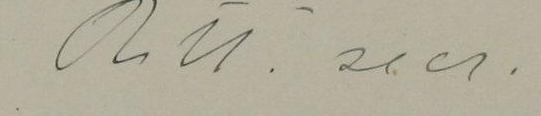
Ritt. secr.
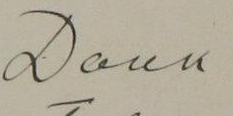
Dank
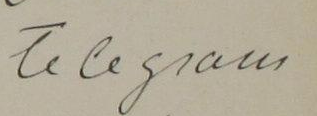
telegram
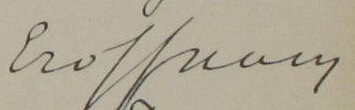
Eroffnung
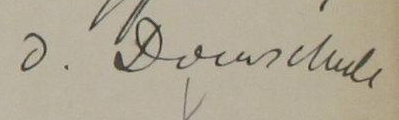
d. Domschule
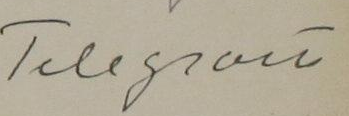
Telegramm
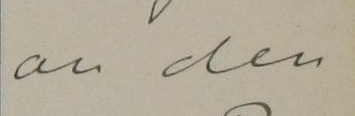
an dem
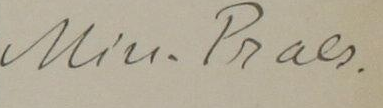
Min. Praes.
